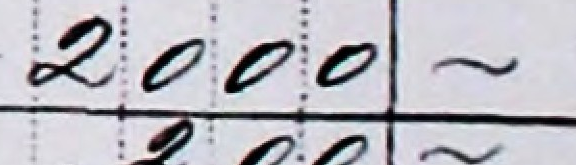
2000 ~
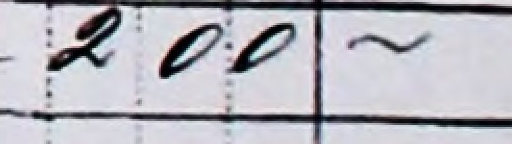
200 ~
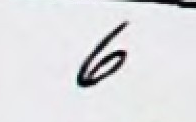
6
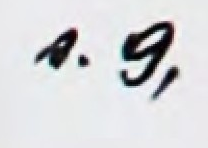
s. 9,
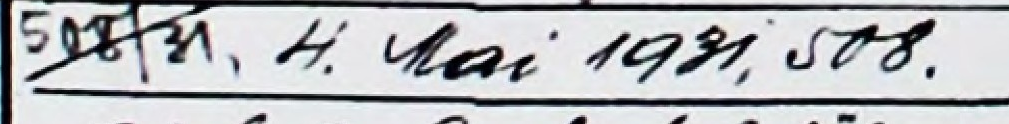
508/31, 4. Mai 1931, 508.
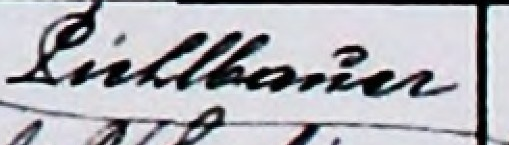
Pichlbauer
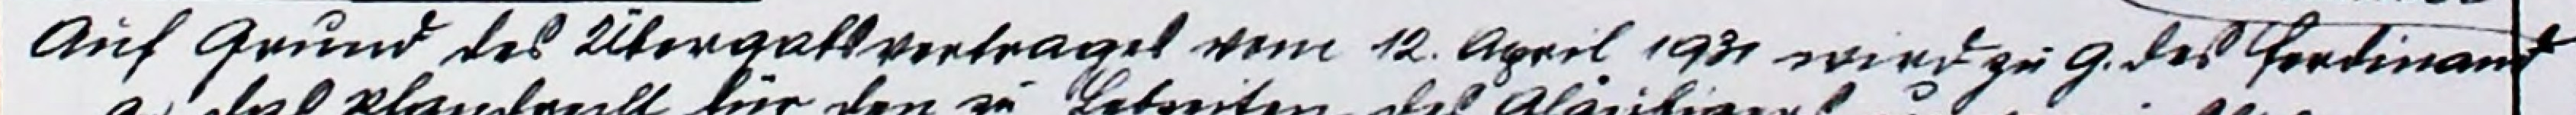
Auf Grund des Übergabsvertrages vom 12. April 1931 wird zu 9. des Ferdinand
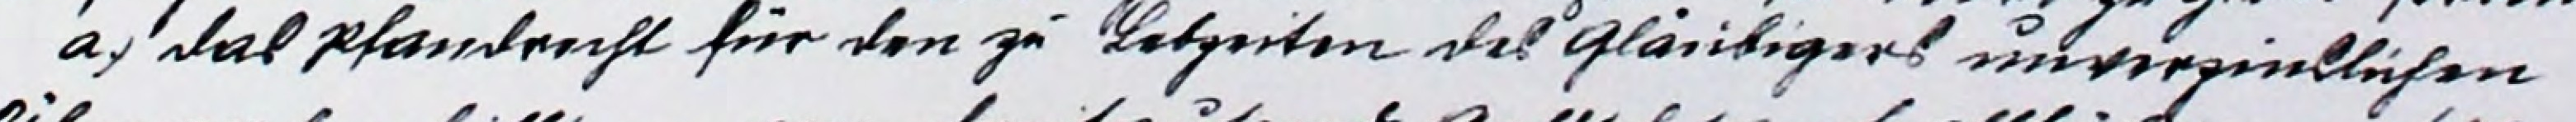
a.) das Pfandrecht für den zu Lebzeiten des Gläubigers unverzinslichen
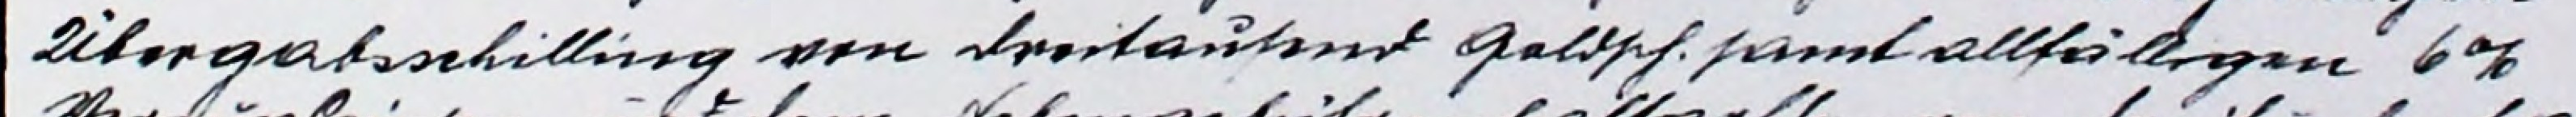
Übergabschilling von dreitausend Galdsch. samt allfälligen 6 %
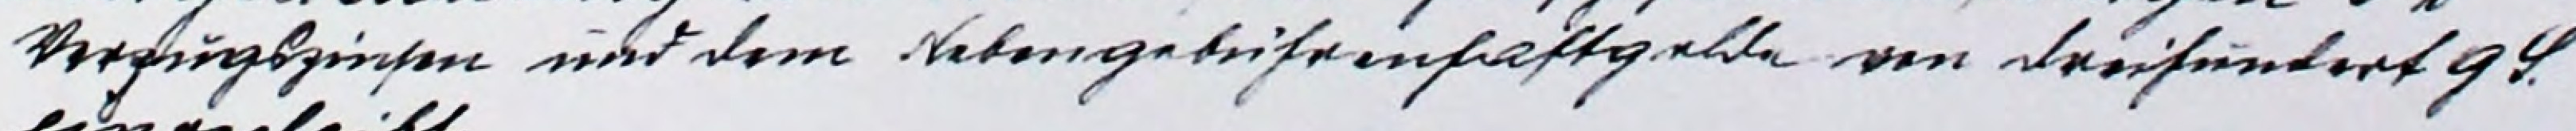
Verzugszinsen und dem Nebengebührenhaftgelde von dreihundert 9 S.
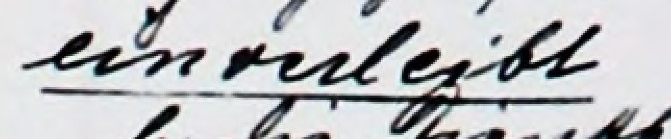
einverleibt
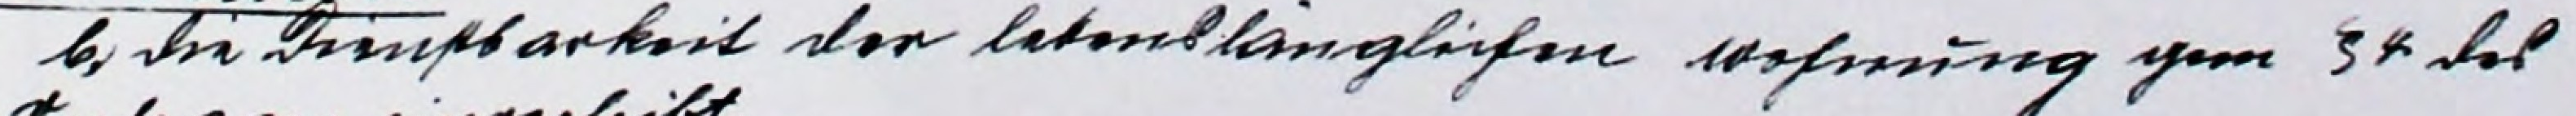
b.) die Dienstbarkeit der lebenslänglichen Wohnung gem § 4 des
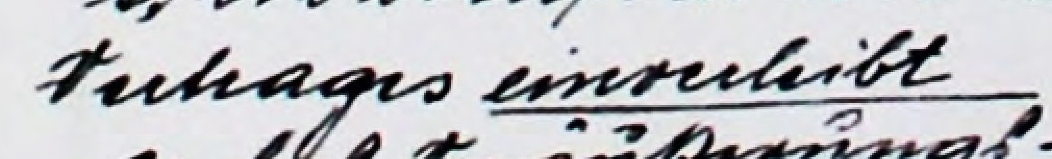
Vertrages einverleibt
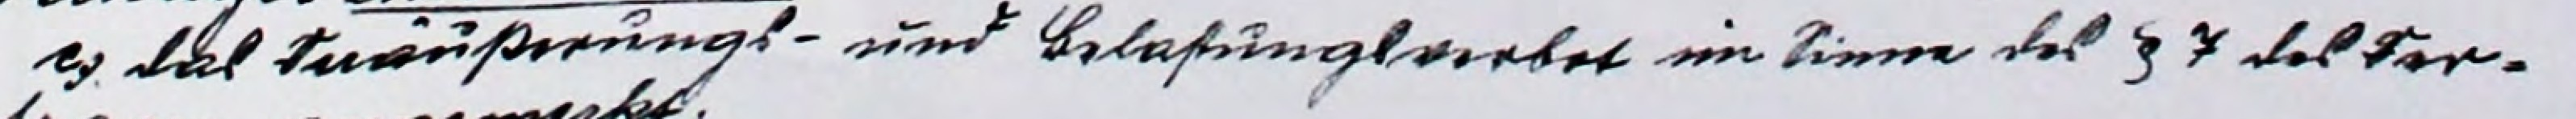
c.) das Veräußerungs- und Belastungsverbot im Sinne des § 7 des Ver=
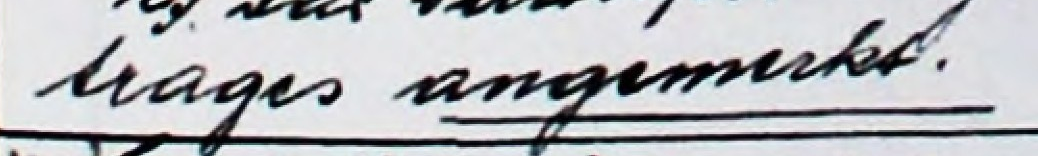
trages angemerkt.
